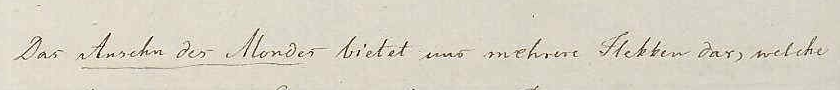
Das Ansehn des Mondes bietet uns mehrere Flekken dar, welche
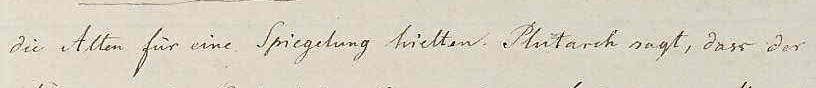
die Alten für eine Spiegelung hielten. Plutarch sagt, dass der
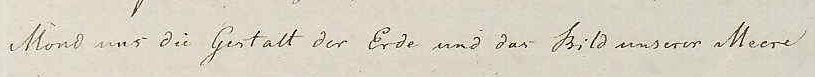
Mond uns die Gestalt der Erde und das Bild unserer Meere
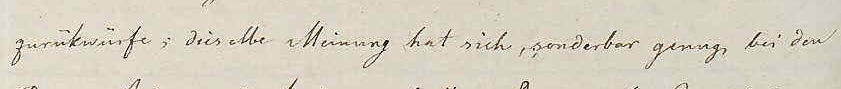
zurükwürfe; dieselbe Meinung hat sich, sonderbar genug, bei den
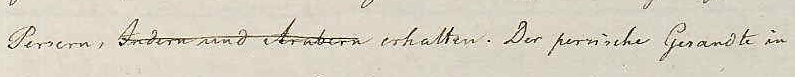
Persern, Indern und Arabern erhalten. Der persische Gesandte in
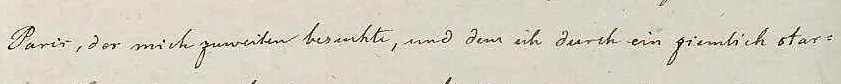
Paris, der mich zuweilen besuchte, und dem ich durch ein ziemlich star-
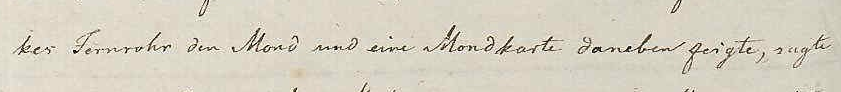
kes Fernrohr den Mond und eine Mondkarte daneben zeigte, sagte
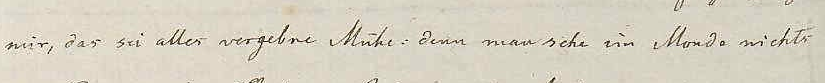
mir, das sei alles vergebne Mühe: denn man sehe im Monde nichts
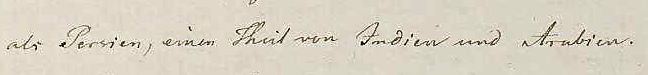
als Persien, einen Theil von Indien und Arabien.
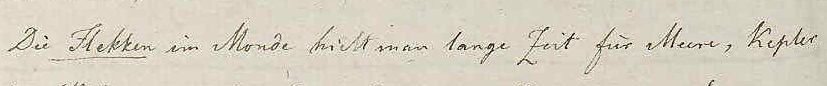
Die Flekken im Monde hielt man lange Zeit für Meere, Kepler
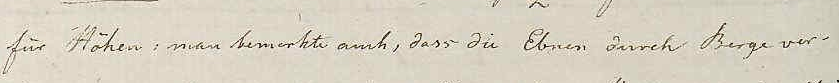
für Höhen: man bemerkte auch, dass die Ebnen durch Berge ver-
